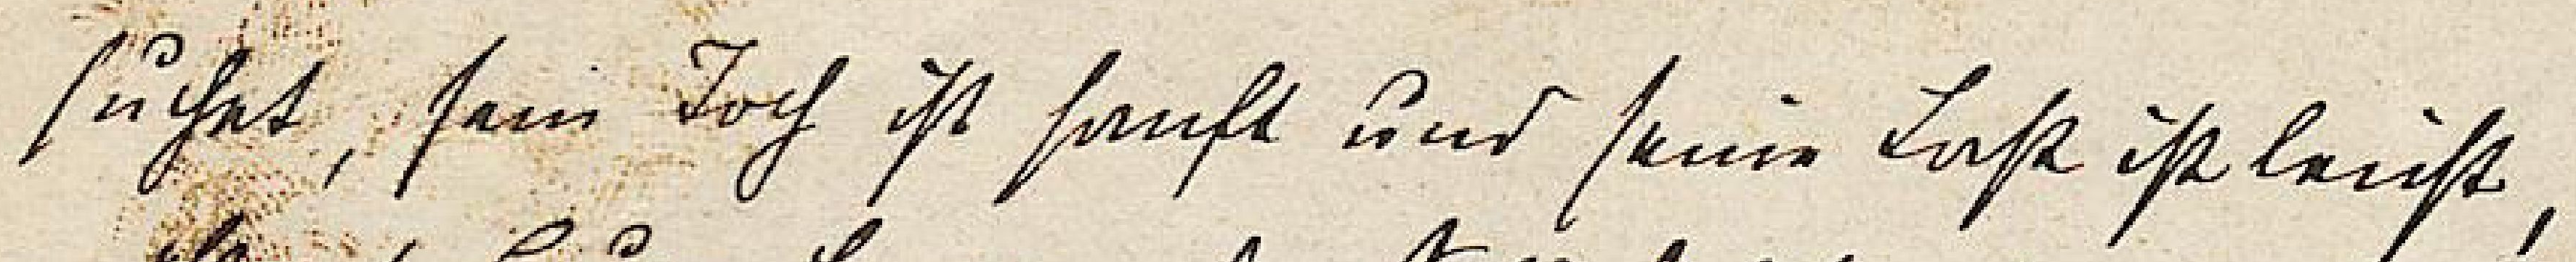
suchet, sein Joch ist sanft und seine Last ist leicht,
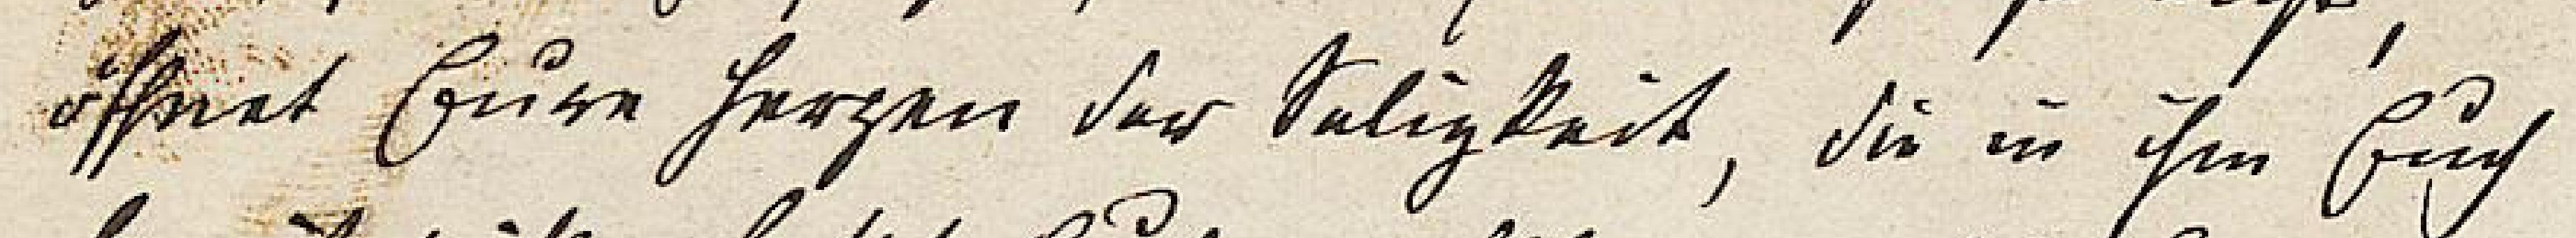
öffnet Eure Herzen der Seligkeit, die in ihm Euch
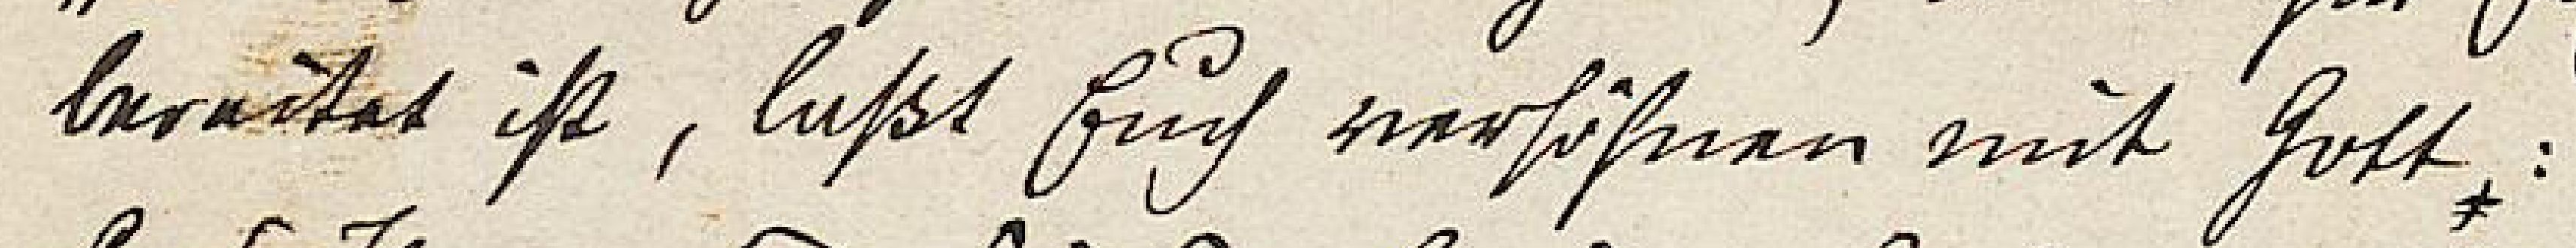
bereitet ist, laßt Euch versöhnen mit Gott,:
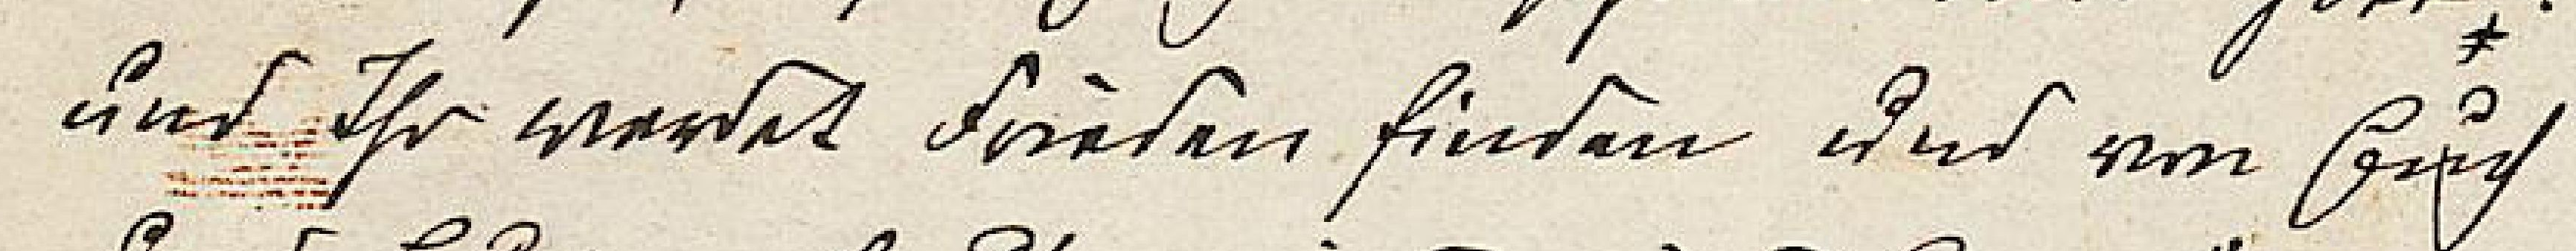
und Ihr werdet Frieden finden und von Euch
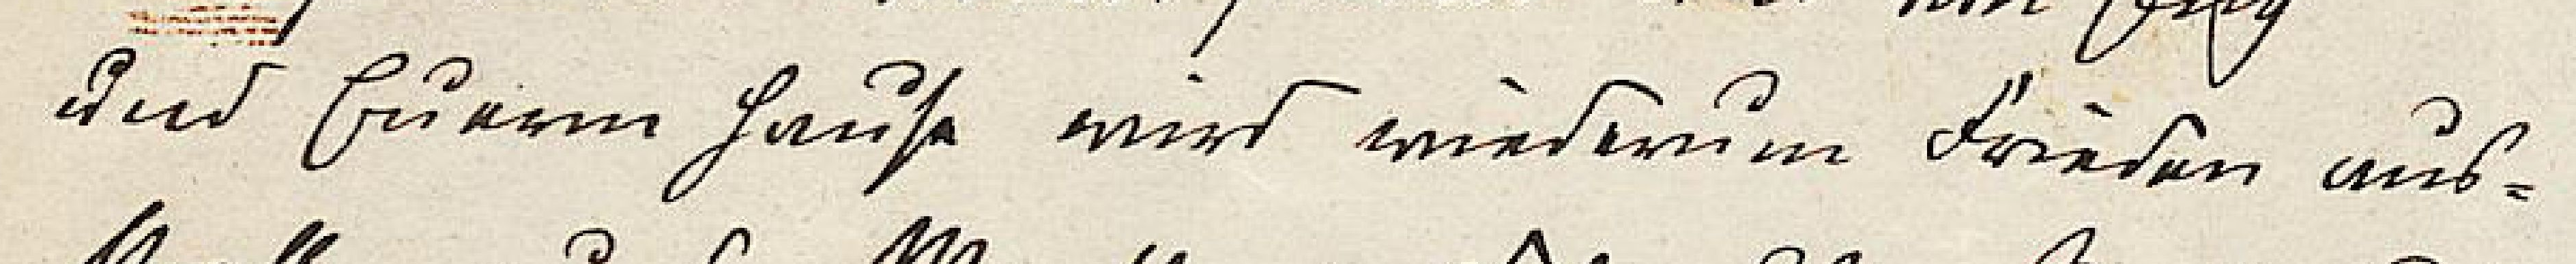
und Euerm Hause wird wiederum Frieden aus¬
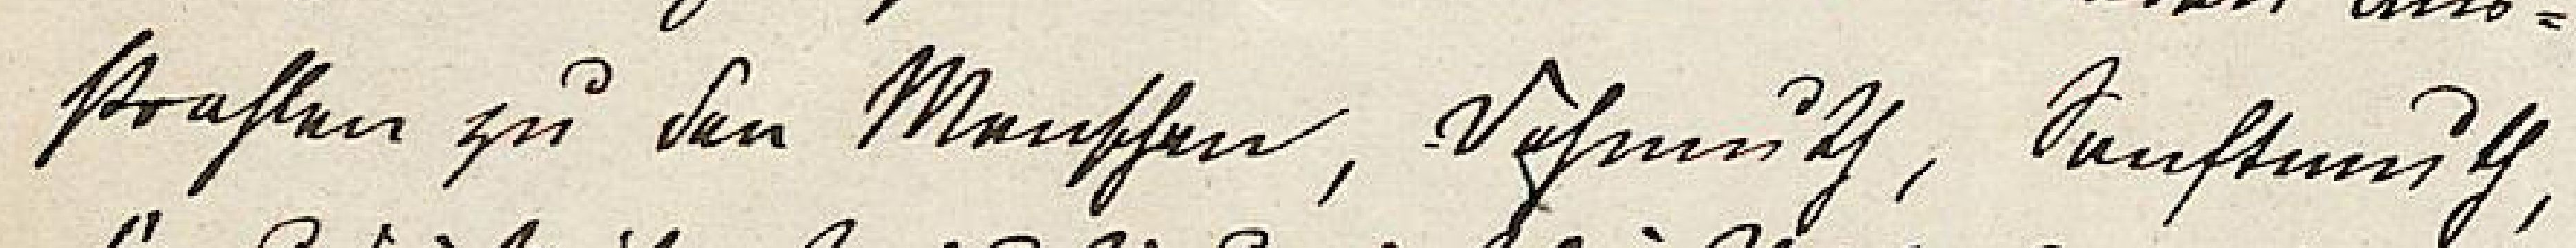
strahlen zu den Menschen, Dehmuth, Sanftmuth,
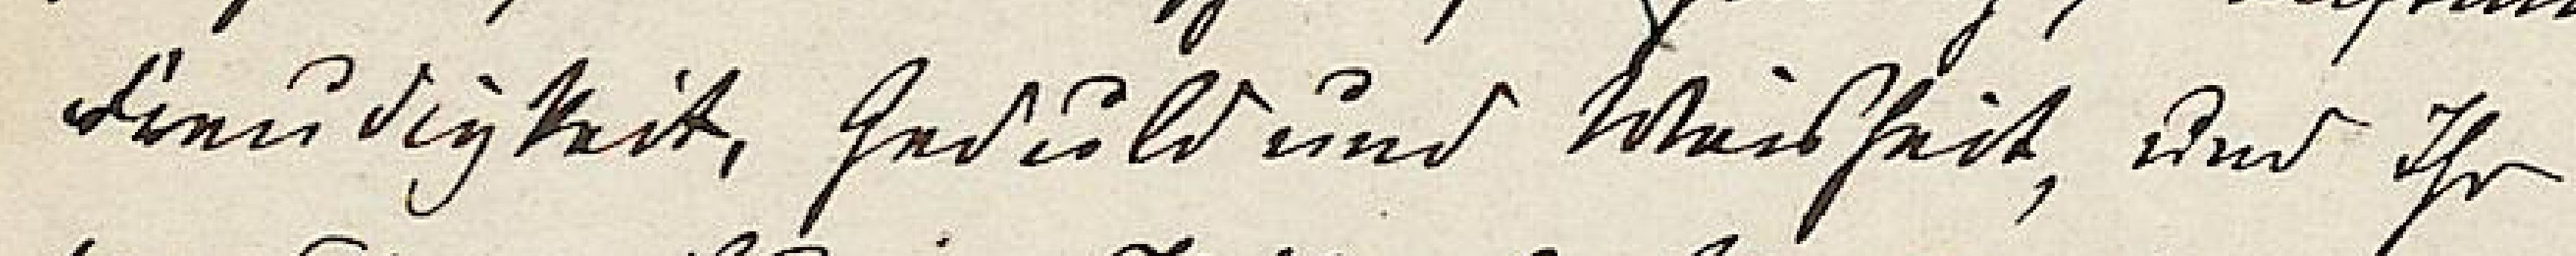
Freudigkeit, Geduld und Weisheit, und Ihr
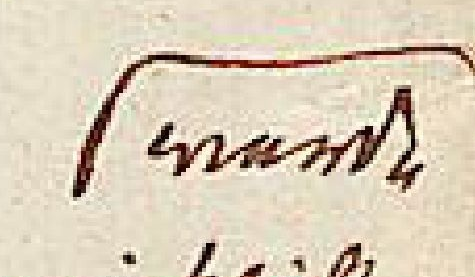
werde
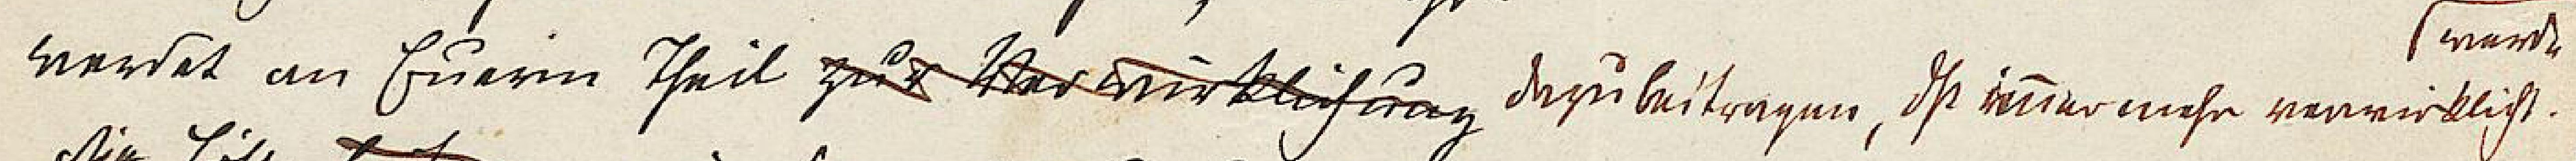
erste an Euerm Theil zur Verwirklichung dazu beitragen, dß imer mehr verwirklicht
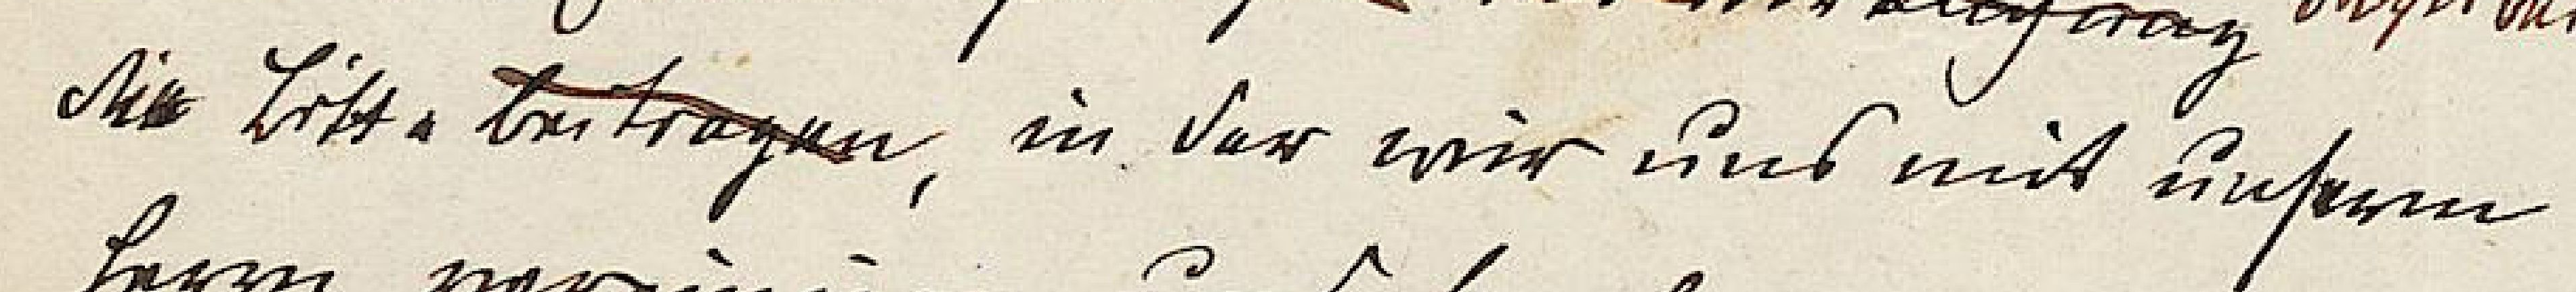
die Bitte beitragen, in der wir uns mit unserm
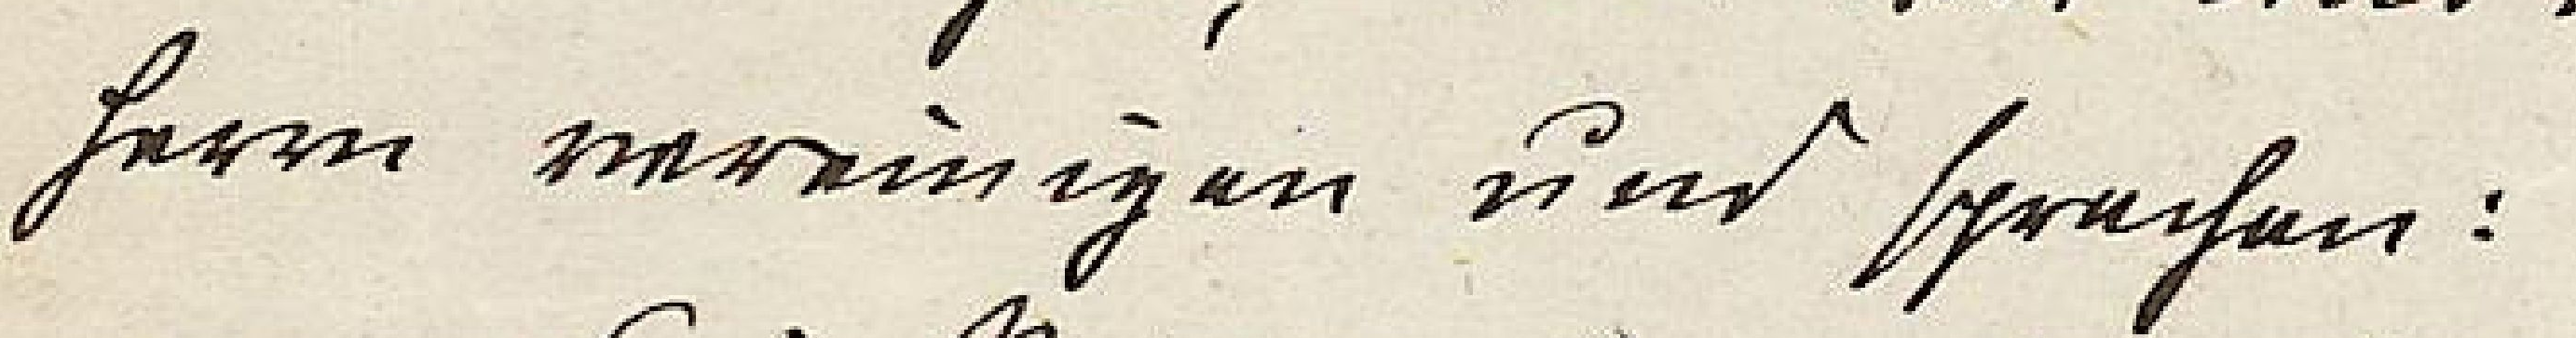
Herrn vereinigen und sprechen:
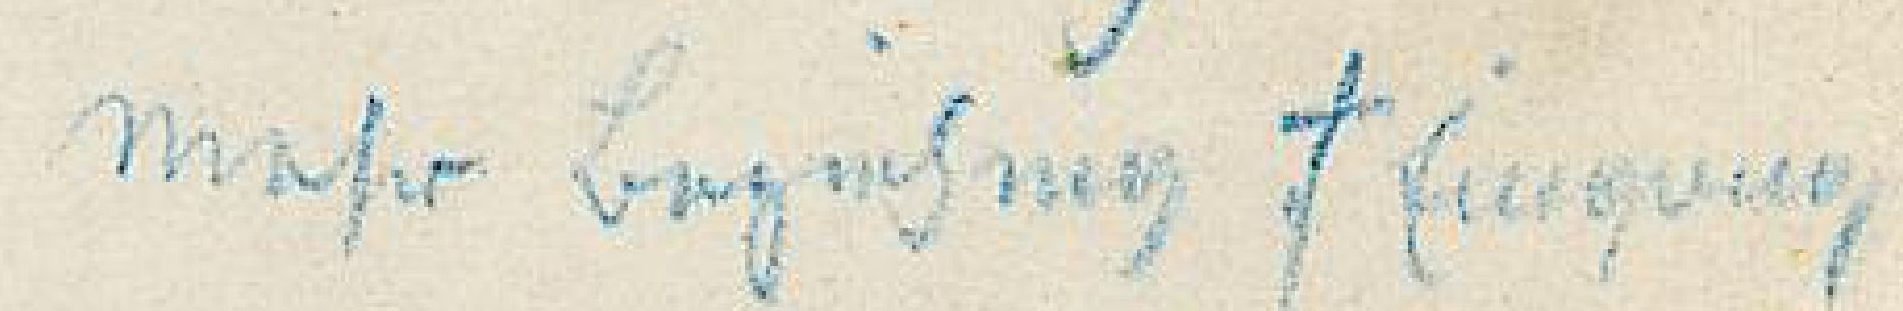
mehr Begrüsung + Eingang
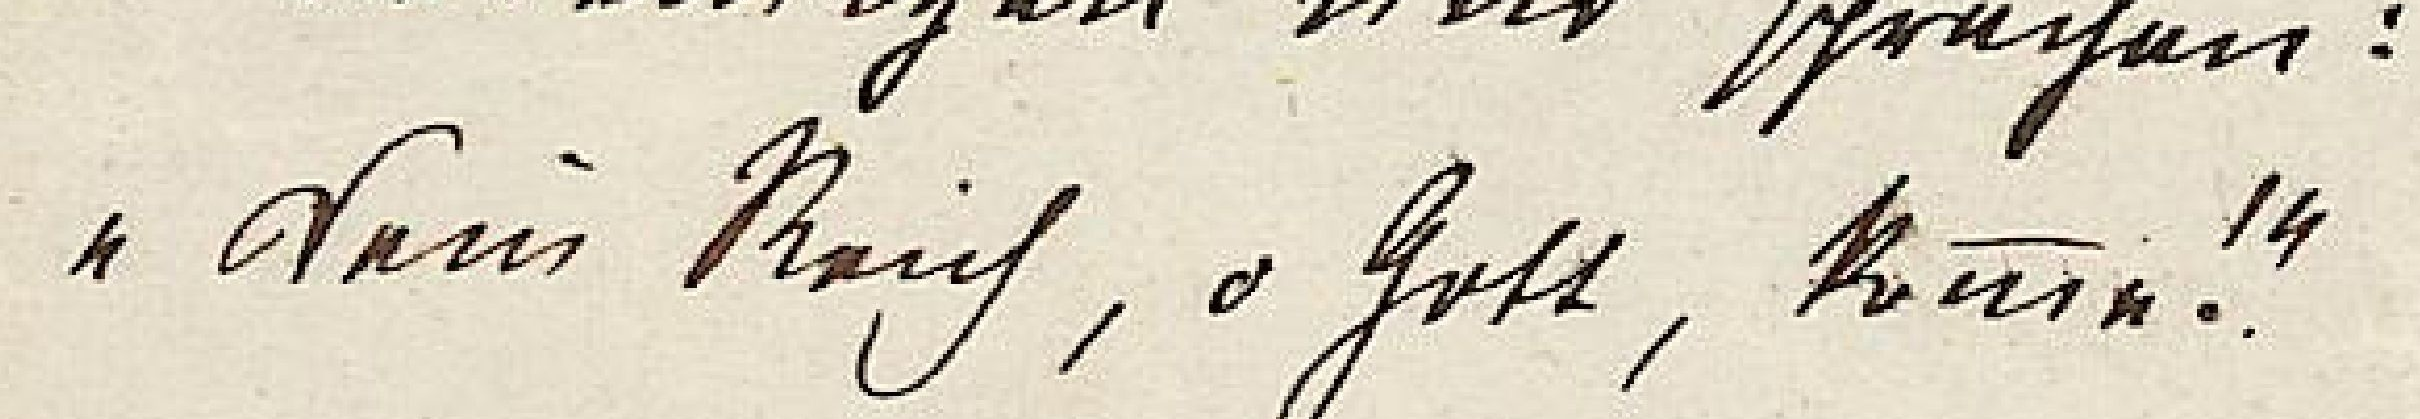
"Dein Reich, o Gott, kome!"
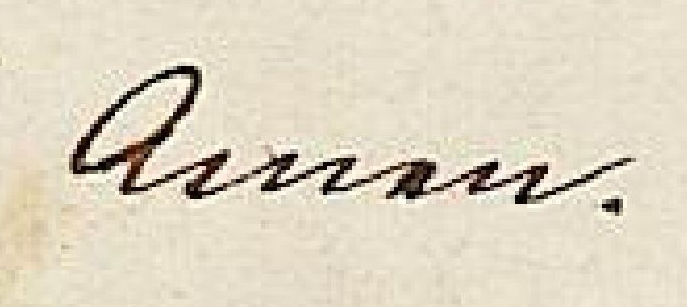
Amen
